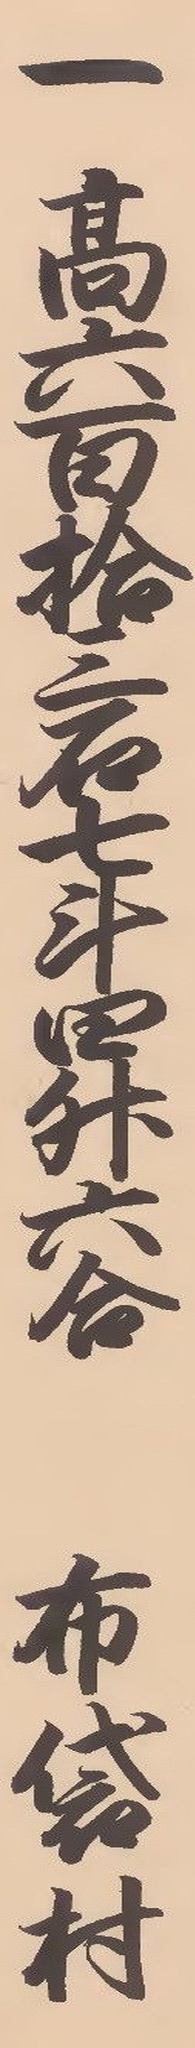一高六百拾三石七斗四升六合布袋村
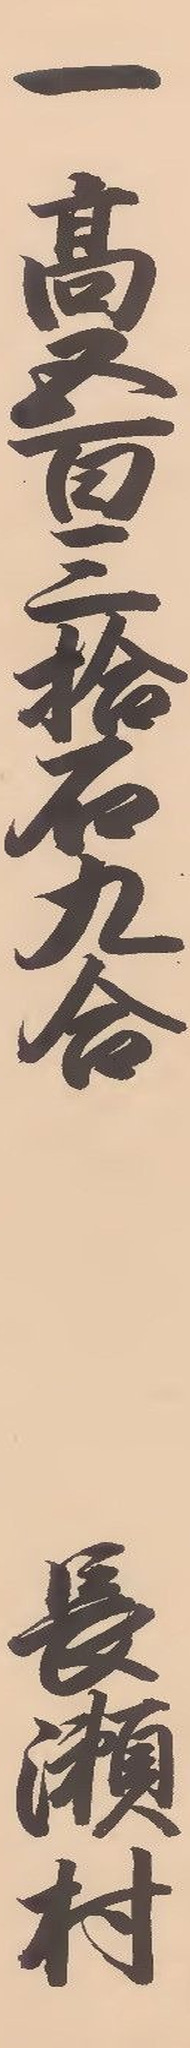一高五百三拾石九合長瀬村
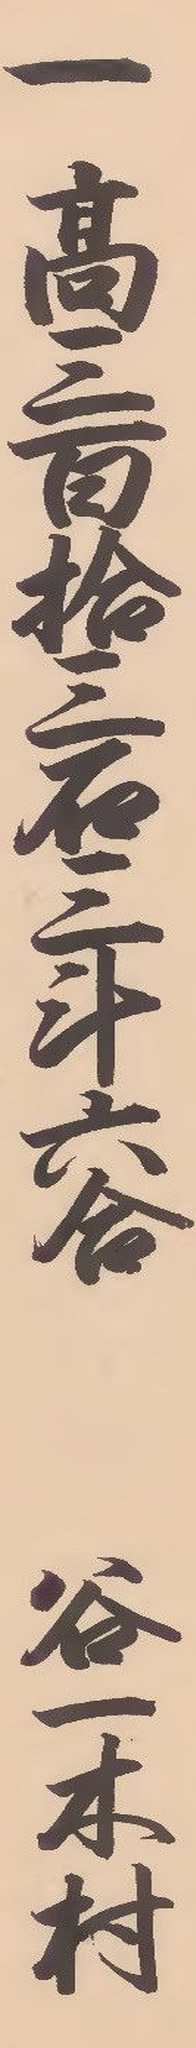一高三百拾三石三斗六合谷一木村

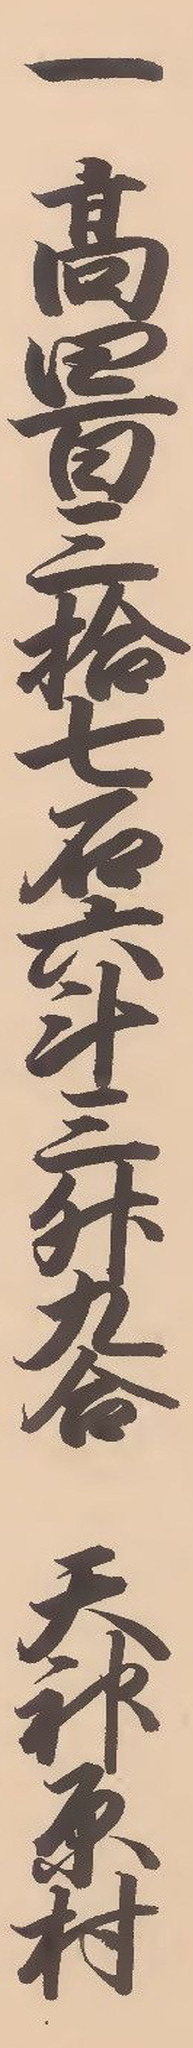一高四百三拾七石六斗三升九合天神原村
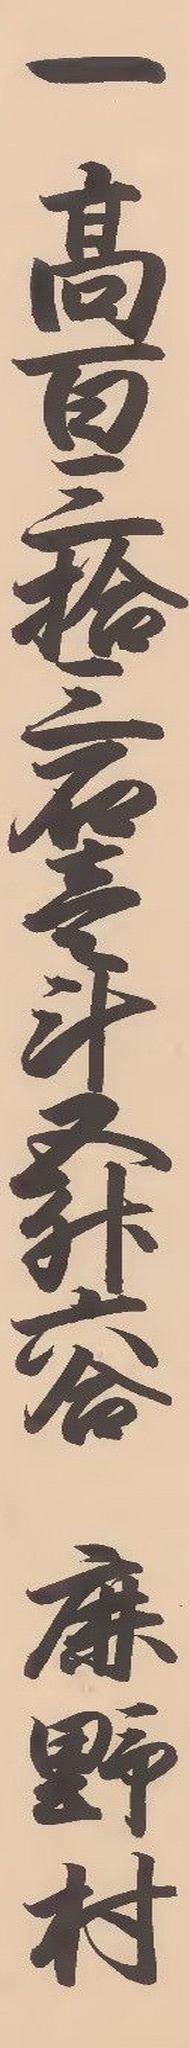一高百三拾三石壱斗五升六合鹿野村
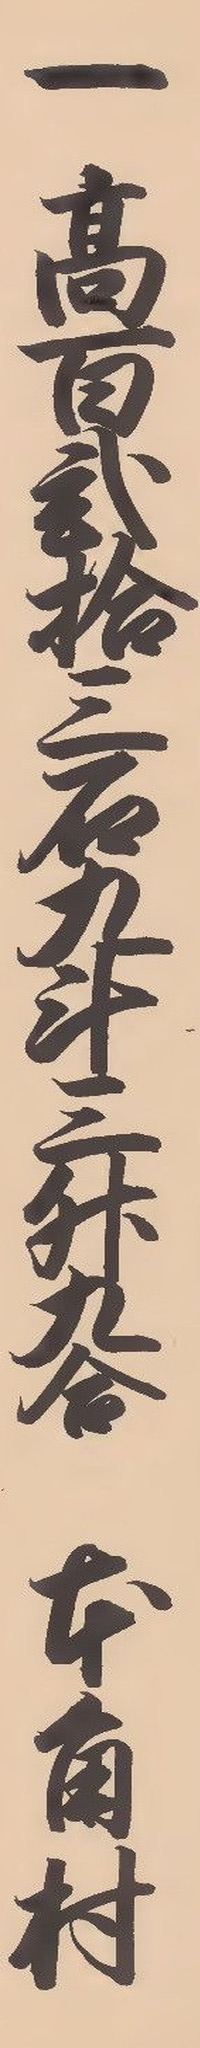一高百弐拾三石九斗三升九合本角村
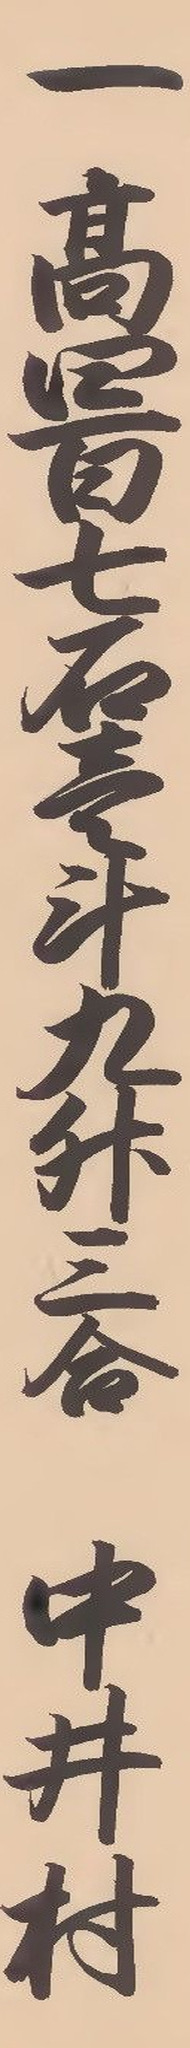一高四百七石壱斗九升三合中井村
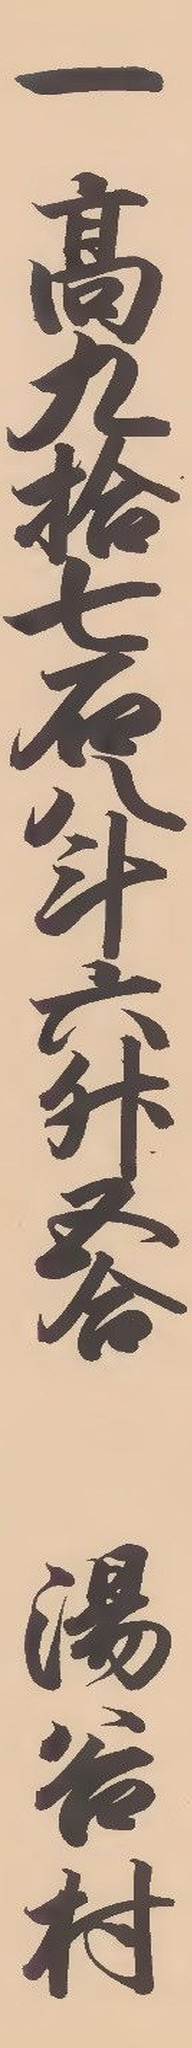一高九拾七石八斗六升五合湯谷村
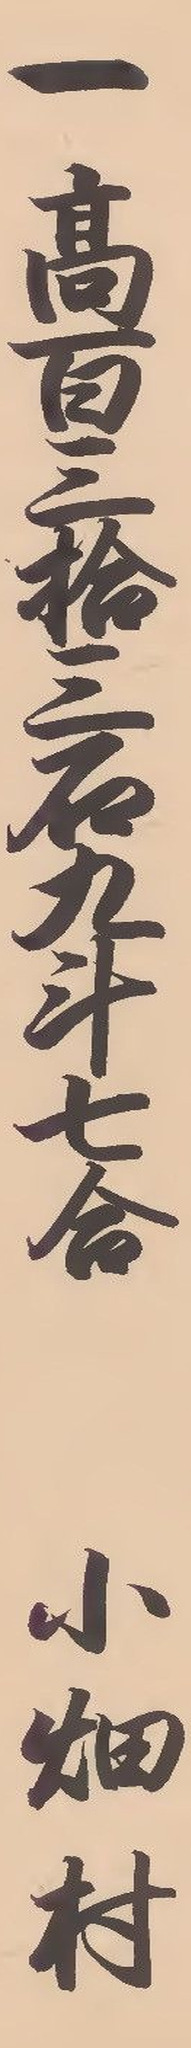一高百三拾三石九斗七合小畑村

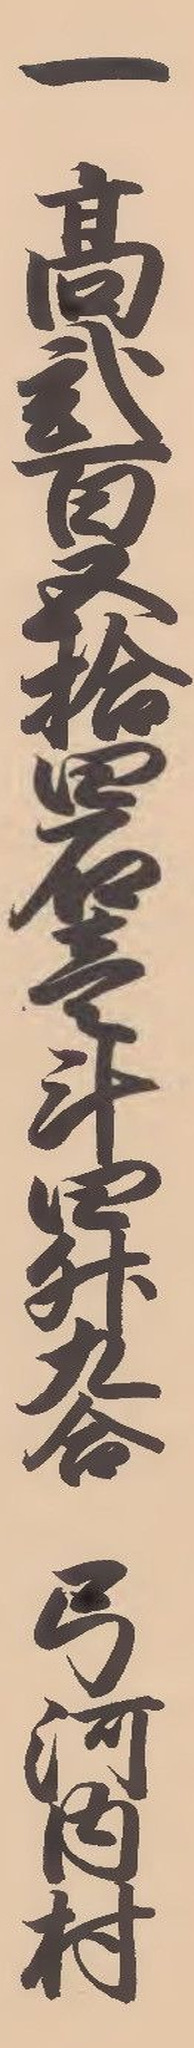一高弐百五拾四石壱斗四升九合弓河内村
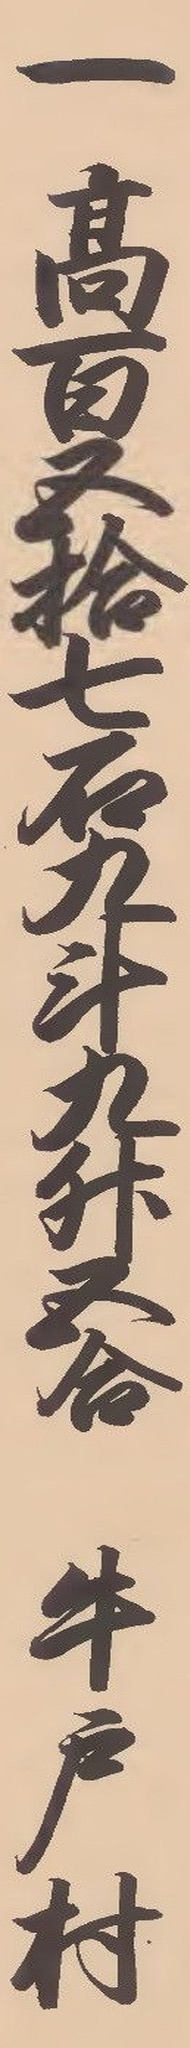一高百五拾七石九斗九升五合牛戸村
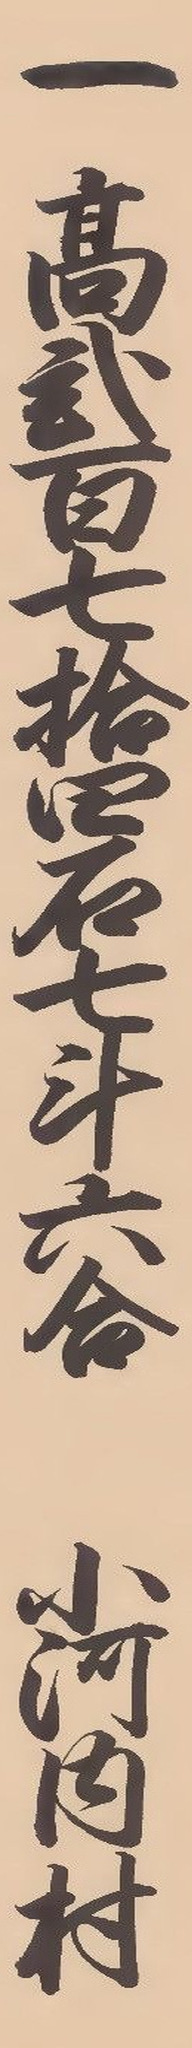一高弐百七拾四石七斗六合小河内村
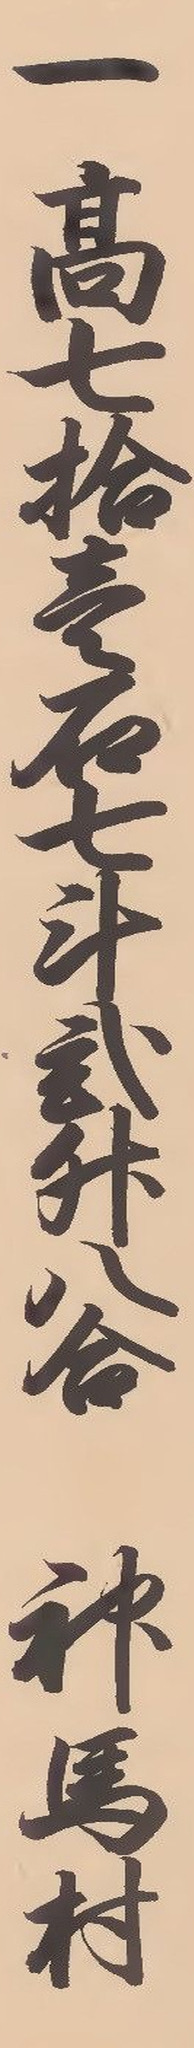一高七拾壱石七斗弐升八合神馬村
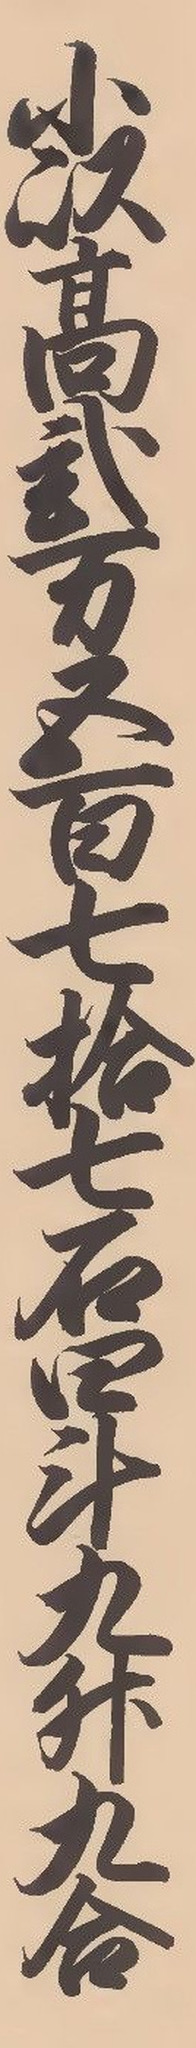小以高弐万五百七拾七石四斗九升九合

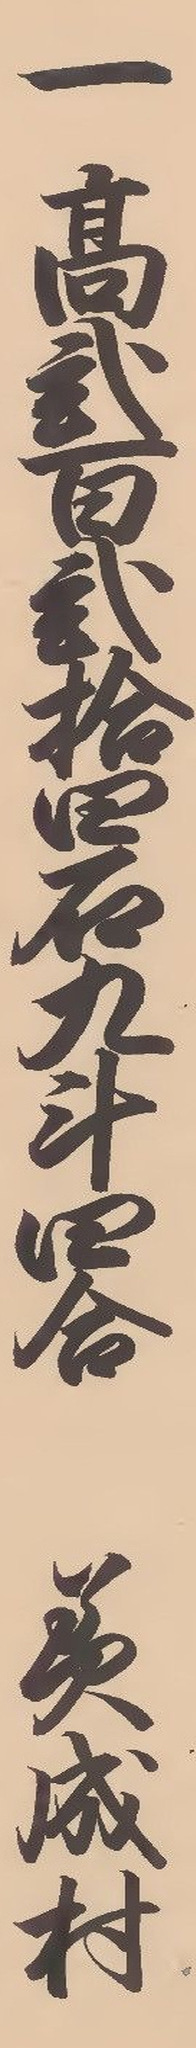一高弐百弐拾四石九斗四合美成村
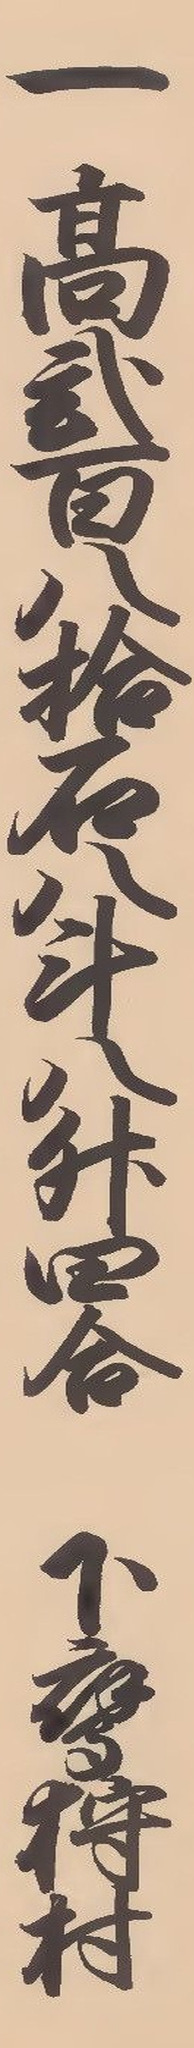一高弐百八拾石八斗八升四合下鷹狩村
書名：因幡国郷帳
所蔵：国立公文書館 National Archives of Japan
